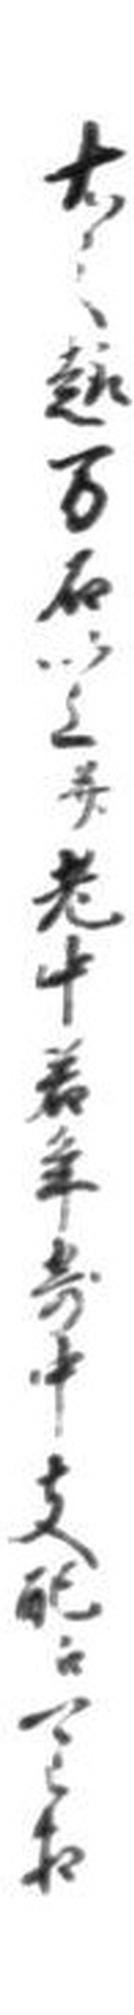右之趣万石以上并老中若年寄中支配被可被相
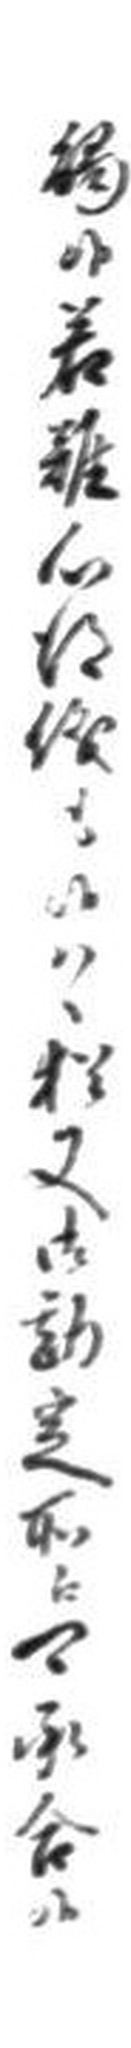触候若難心得儀も候ハヽ猶又御勘定所江可承合候
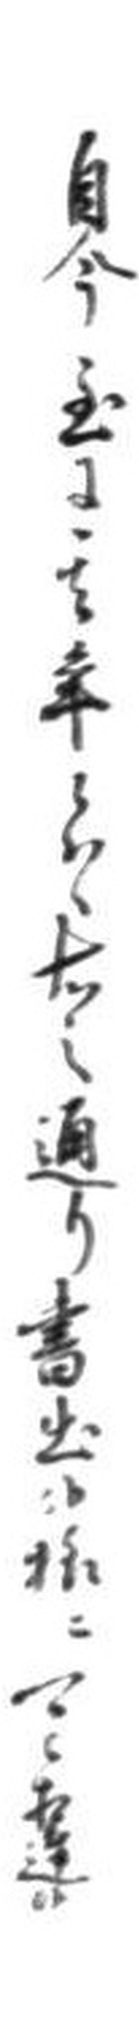自今至に其年候ハヽ右之通り書出候様ニ可被相達候
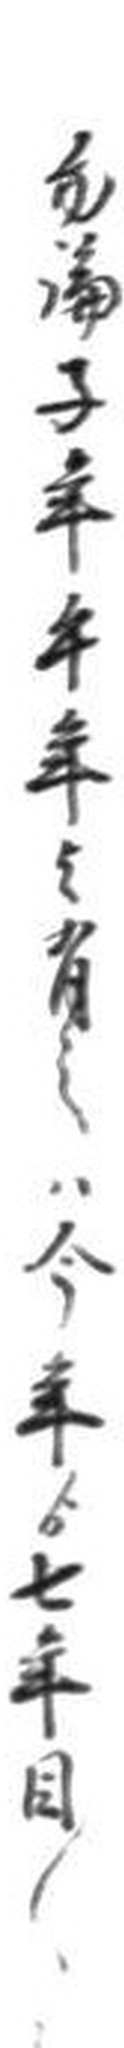勿論子年午年与有之ハ今年ゟ七年目［］

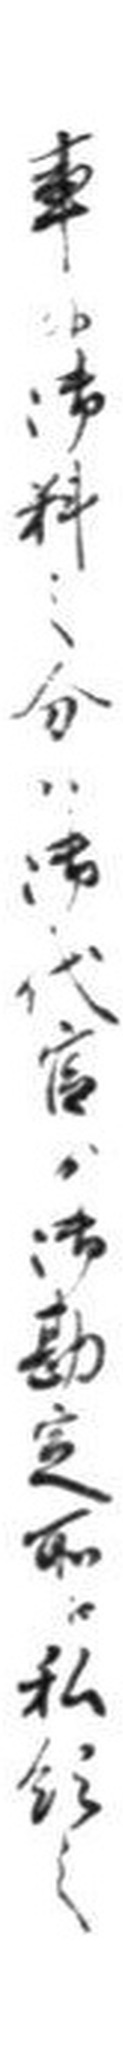事候御料之分ハ御代官ゟ御勘定所え私領之
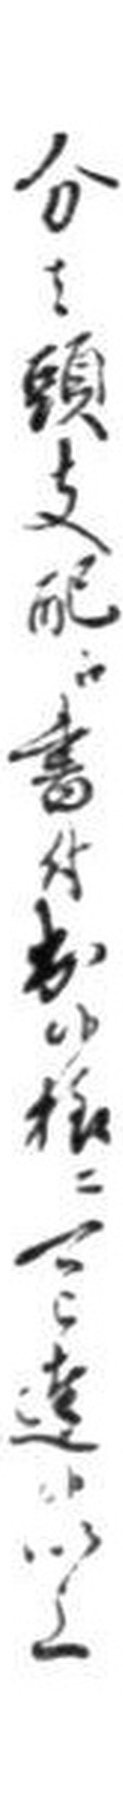分は頭支配え書付出候様ニ可被達候以上
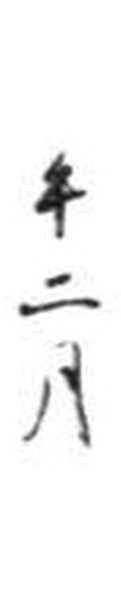午二月
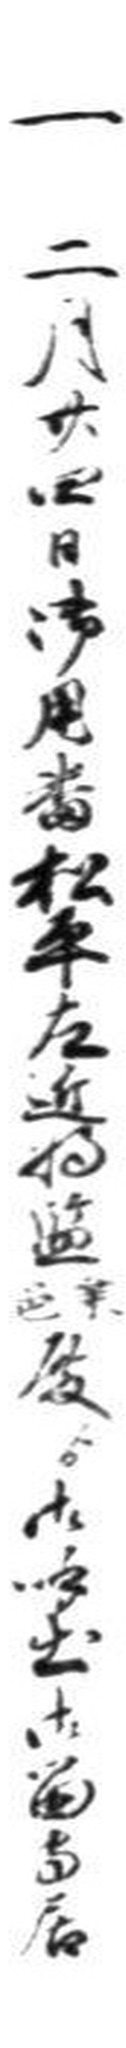一二月廿四日御用番松平左近将監乗邑殿ゟ御呼出御留守居
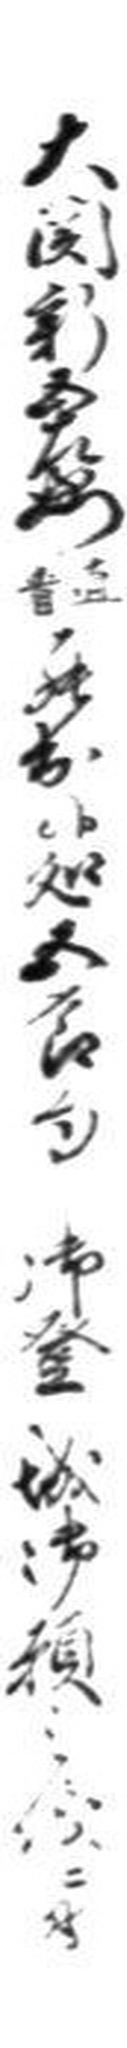大関新五左衛門直宥罷出候処五節句御登城御願之儀ニ付
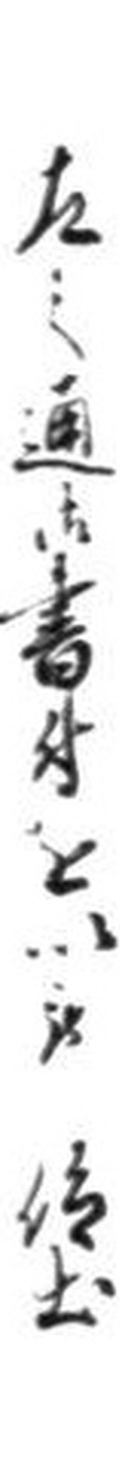左之通御書付を以被仰出
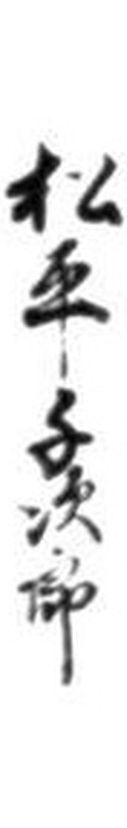松平千次郎
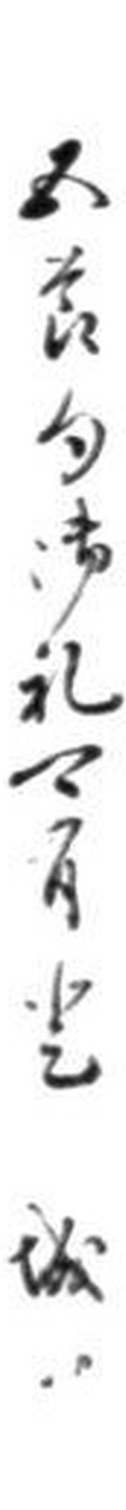五節句御礼可有登城候
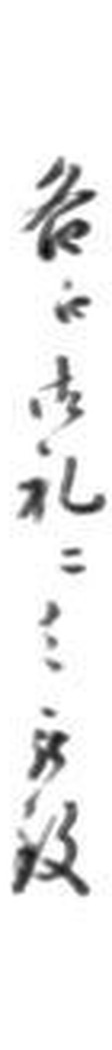各え御礼ニは被致
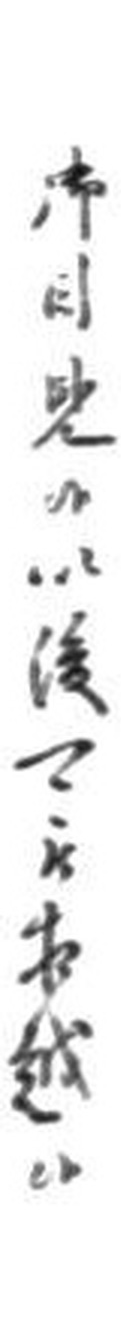御目見候以後可被相越候
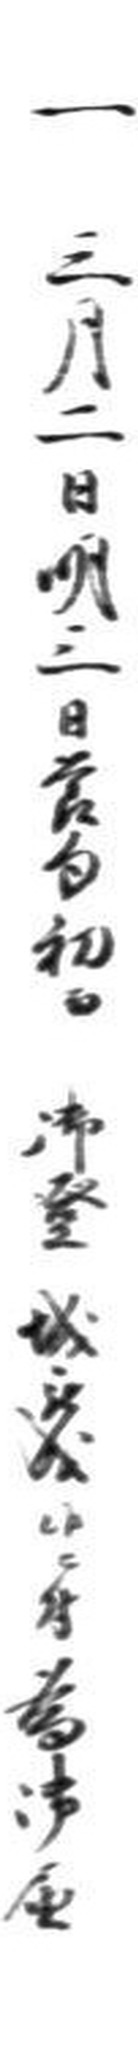一三月二日明三日節句初而御登城被成候ニ付為御届
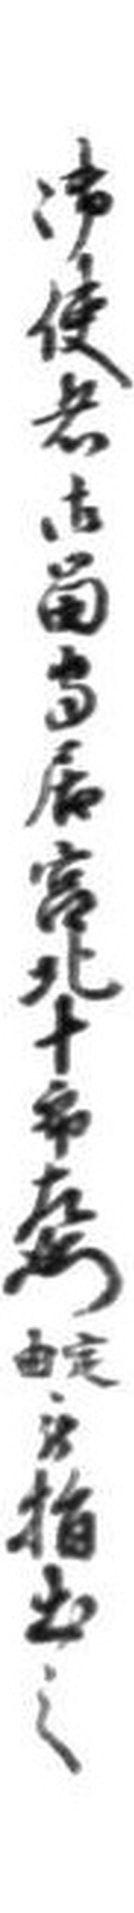御使者御留守居宮北十郎左衛門定由被指出之
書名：家譜 四十 宗矩公 従享保十一年到享保十二年
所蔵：福井県文書館 Fukui Prefectural Archives
